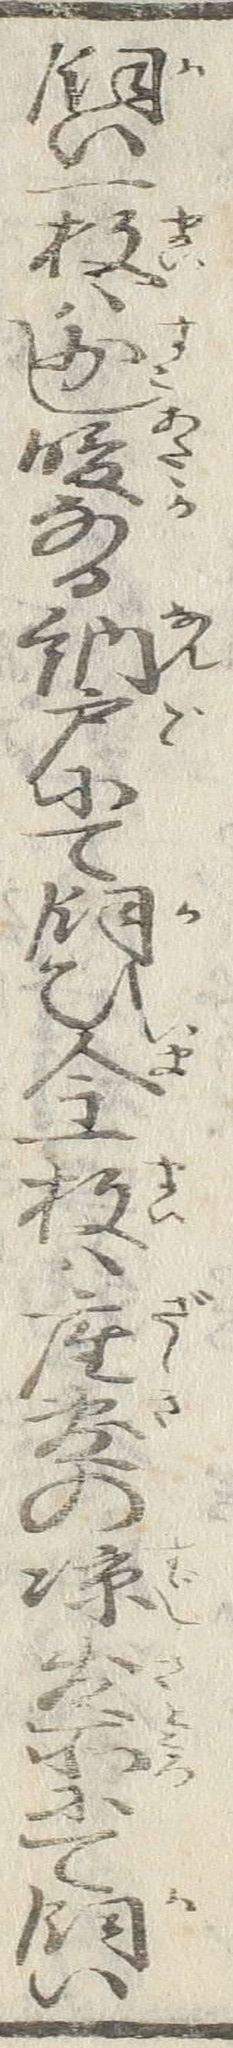飼い一枚は少し暖なる納戸にて飼ひ今一枚は座敷の涼敷所にて飼い
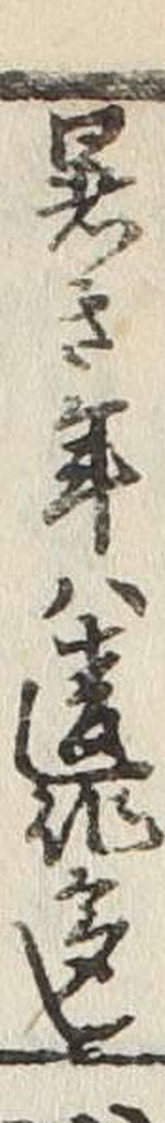暑き年は違作多し
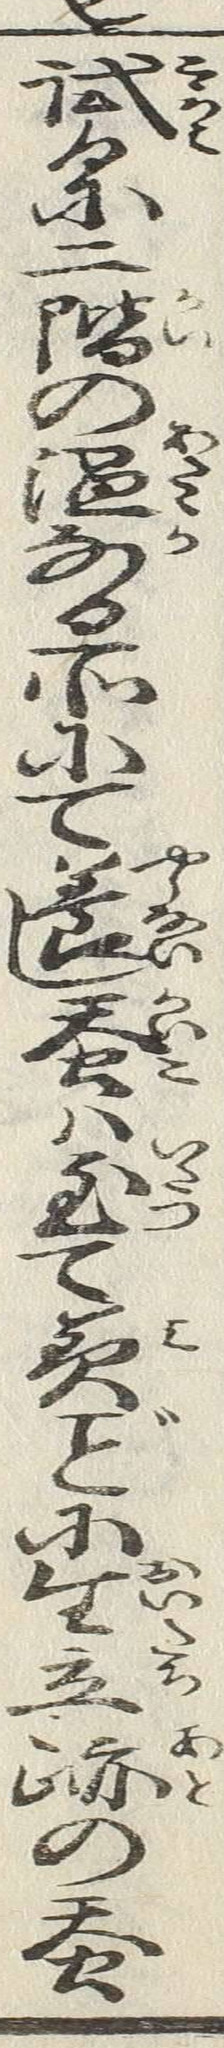試るに二階の温なる所にて養し蚕は至て美ごとに生立跡の蚕
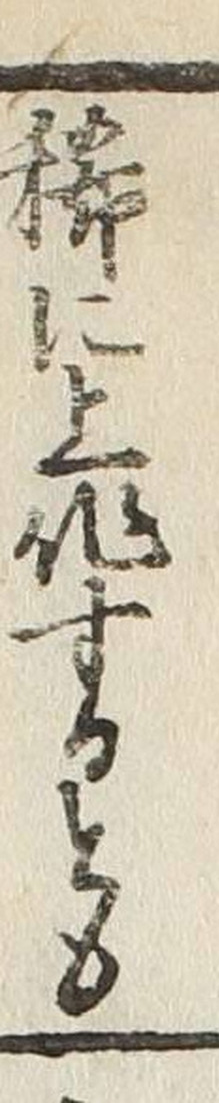稀に上作するとも
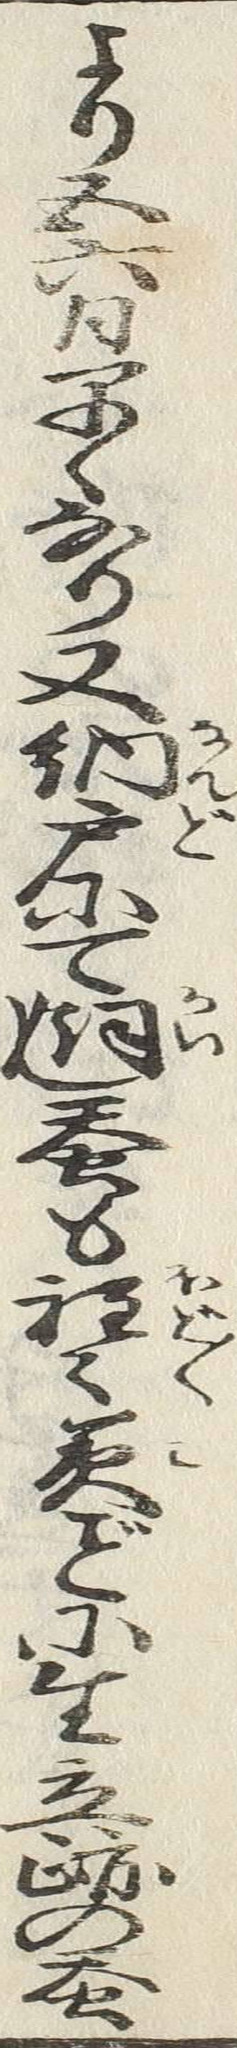より五六日早くなり又納戸にて飼し蚕も程々美ごとに生立跡の蚕
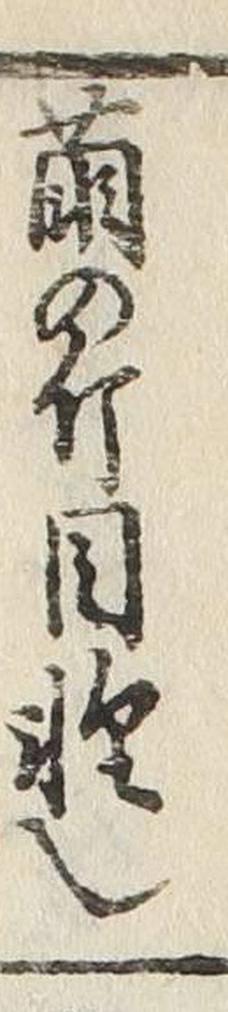繭の斤目軽し
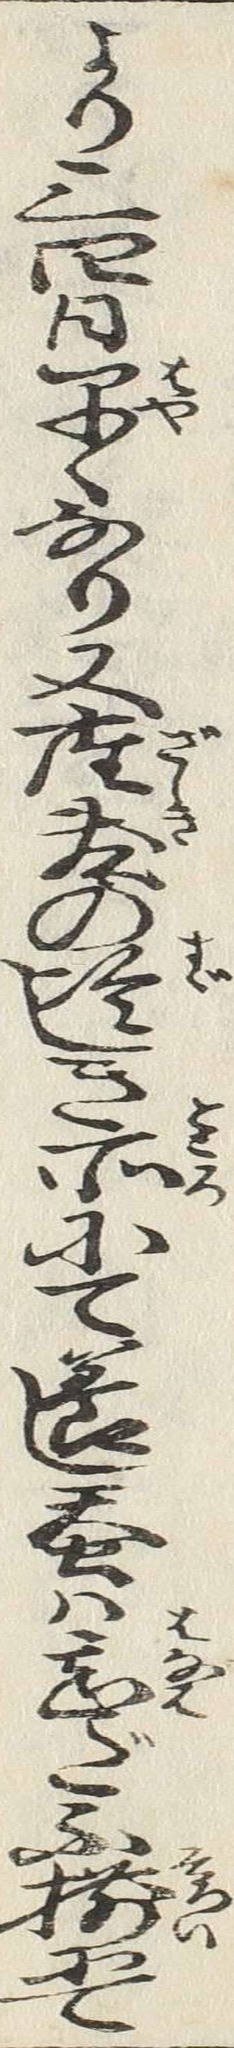より三四日早くなり又座敷の冷しき所にて養し蚕は甚だふ揃にて
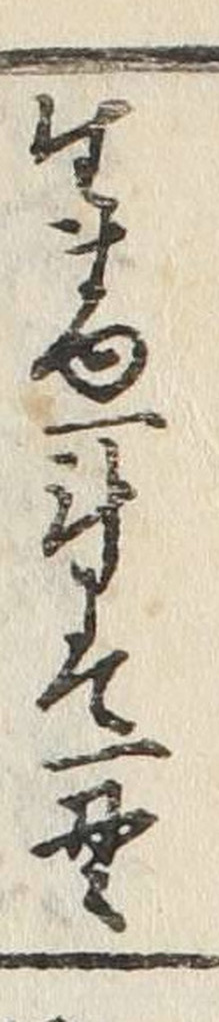生まゆ一斗は一貫
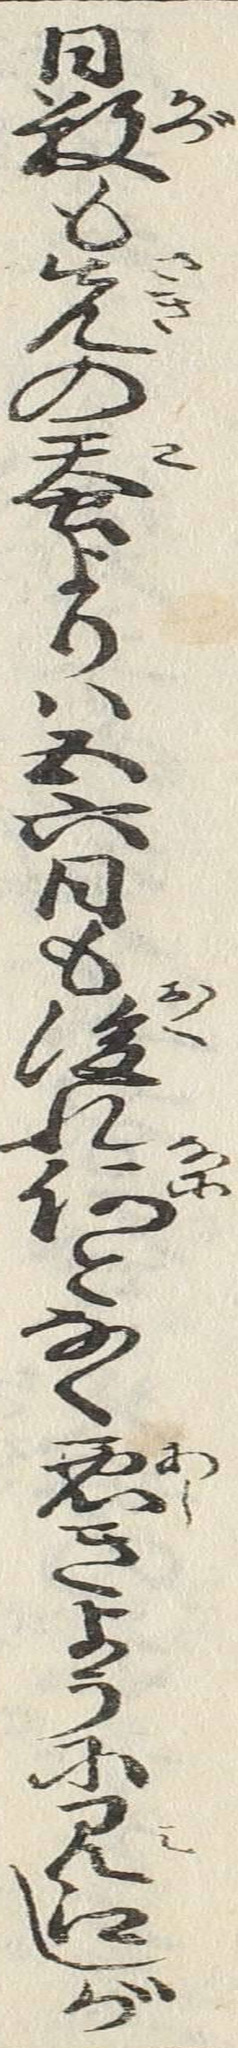日数も先の蚕よりは五六日も後れ何となく悪きように見えしが
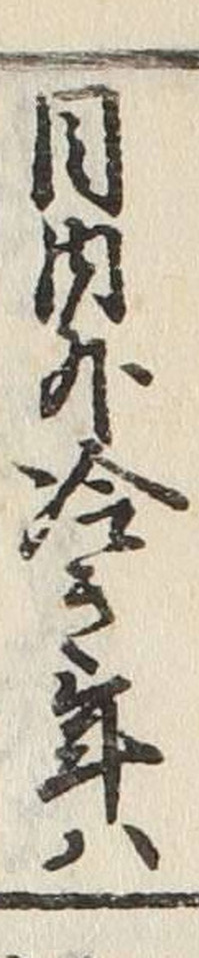目内外冷き年は
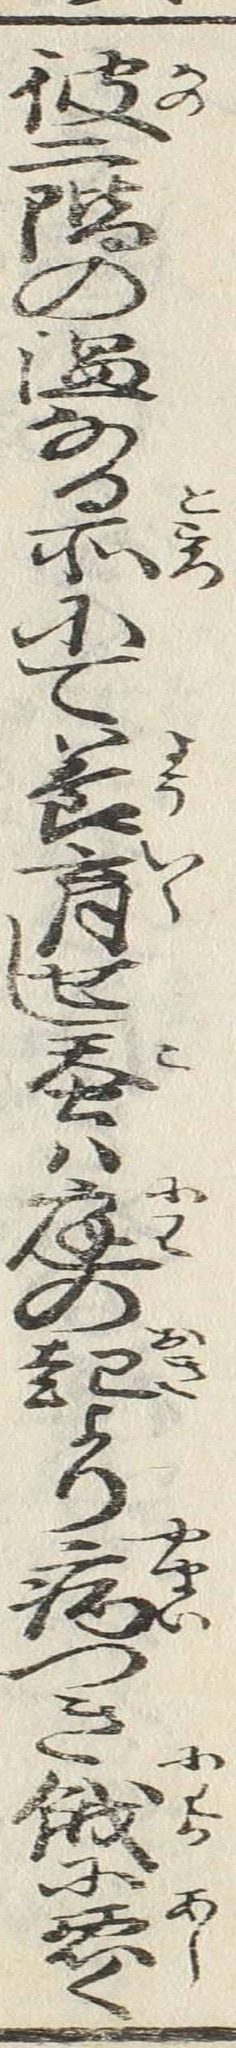彼二階の温なる所にて養育せし蚕は庭の起より病つき俄に悪く
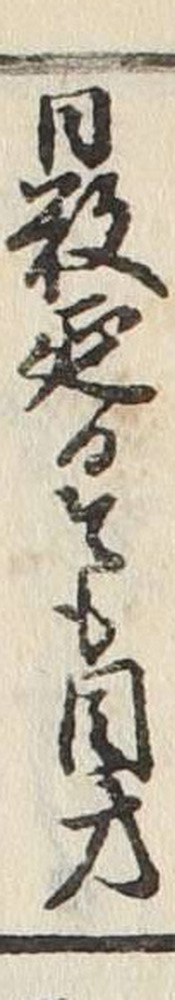日数延るとも目方
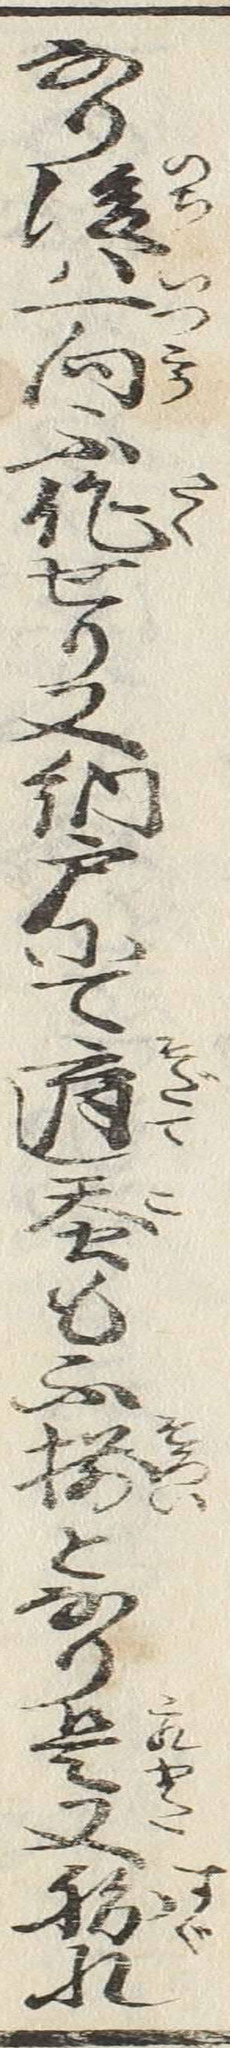なり後は一向ふ作せり又納戸にて育し蚕もふ揃となり是又勝れ
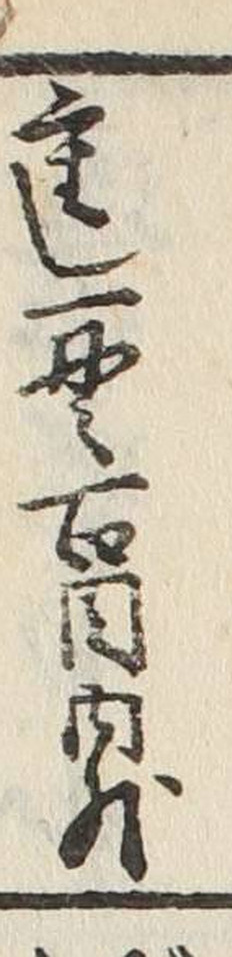重し一貫百目内外
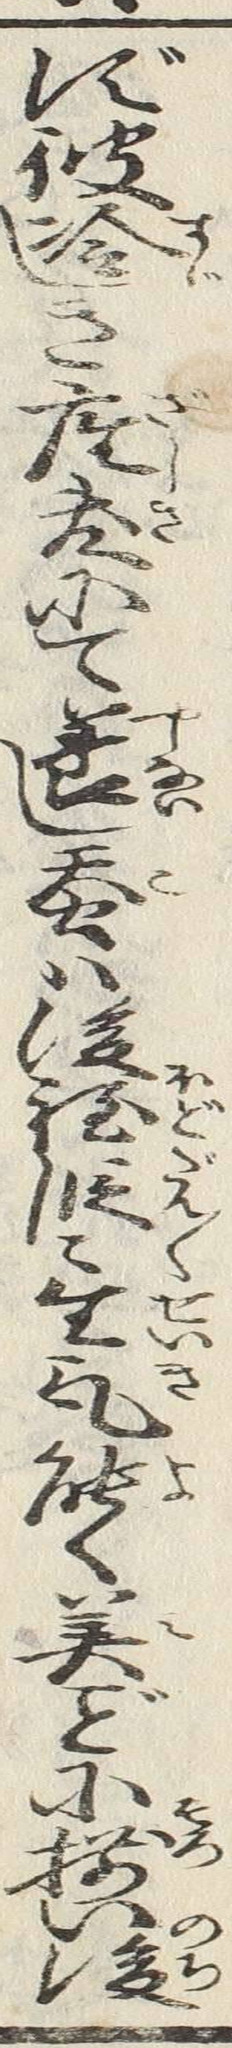ず彼冷しき座敷にて養し蚕は後程段々生気能く美ごとに揃い後
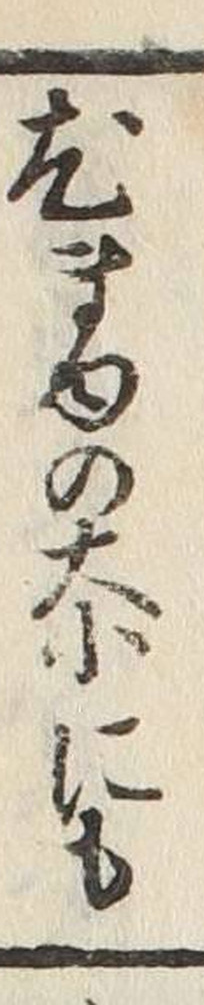尤まゆの大小にも
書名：養蠶實驗録
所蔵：東京大学農学生命科学図書館 国文学研究資料館
